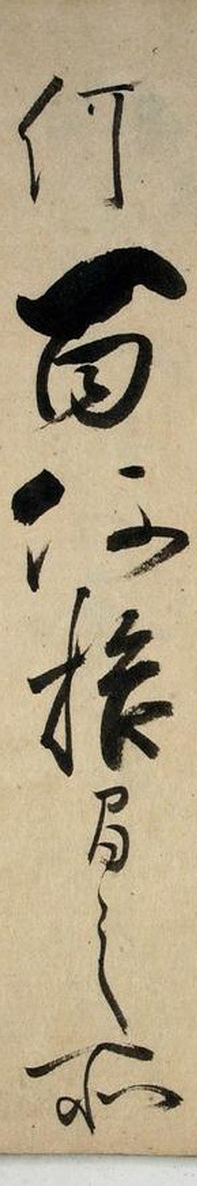何百何拾間之所
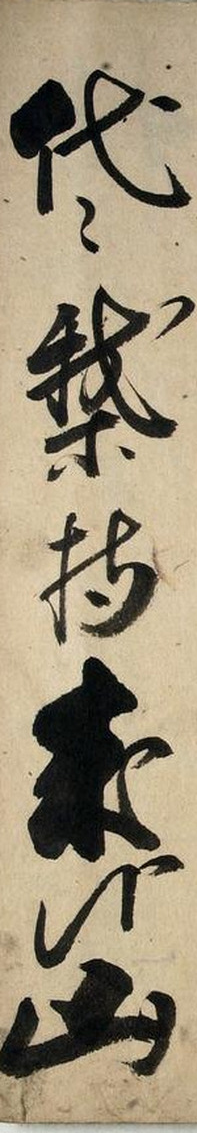代々我等持来候山

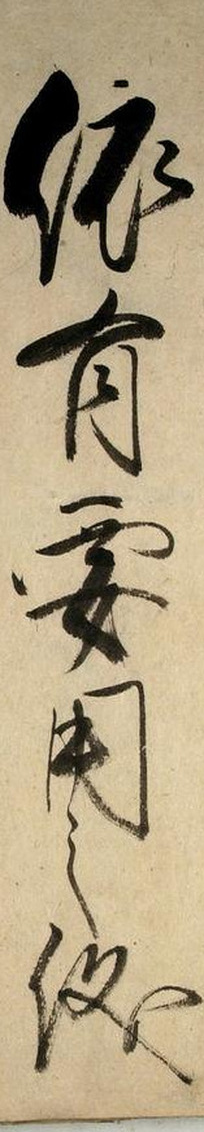依有要用之儀
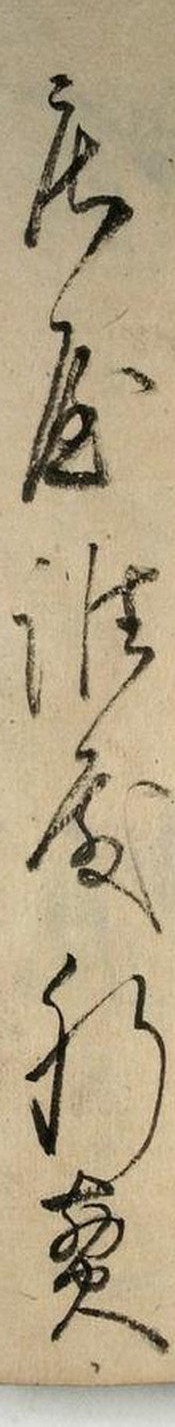庄屋誰殿肝煎
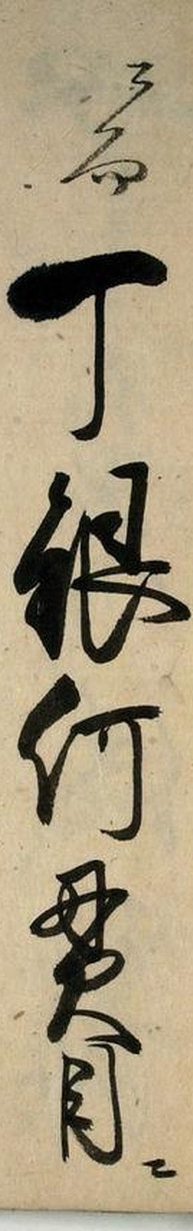に而丁銀何貫目に
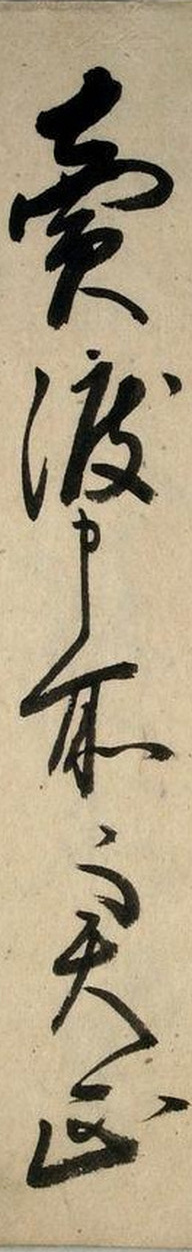売渡申所実正
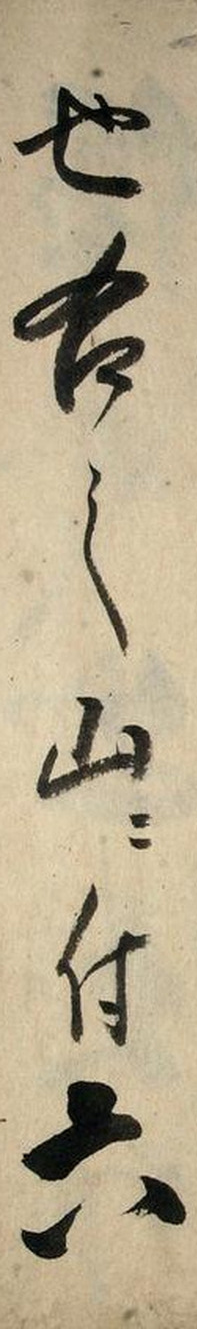也右之山に付六

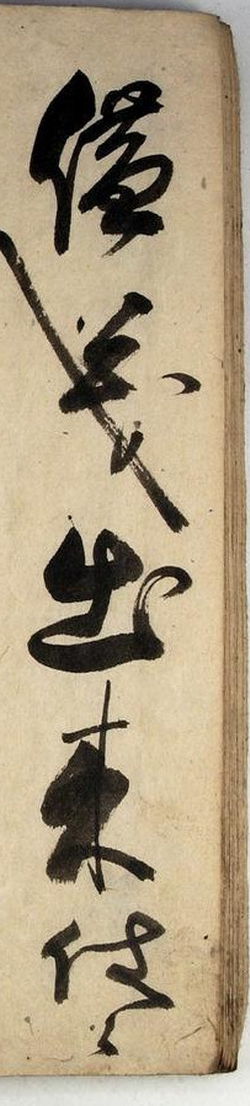借義出来仕候
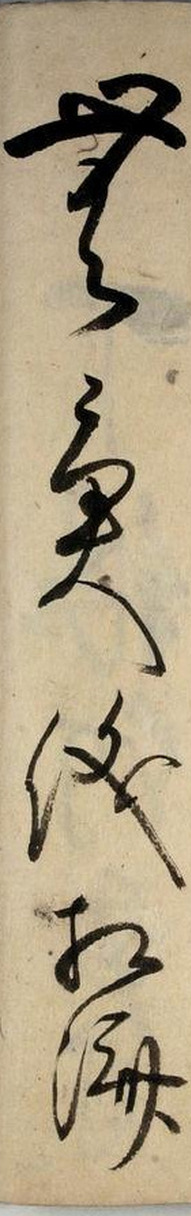無実儀相済
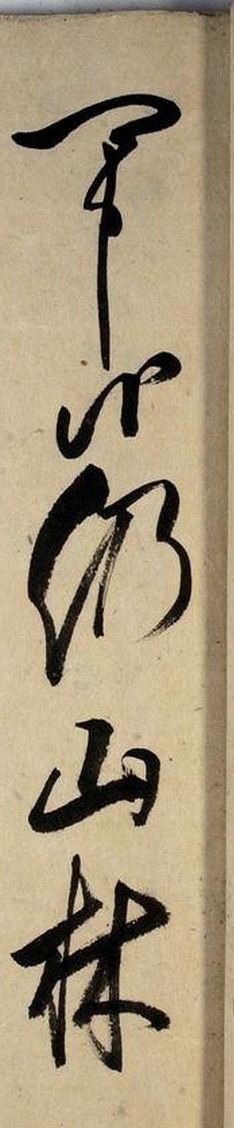可申候仍山林
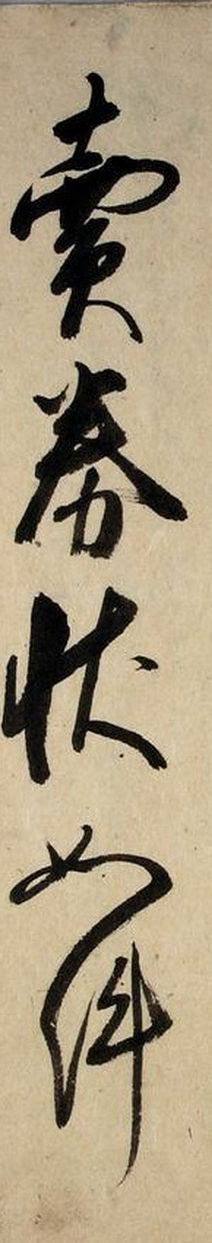売券状如件
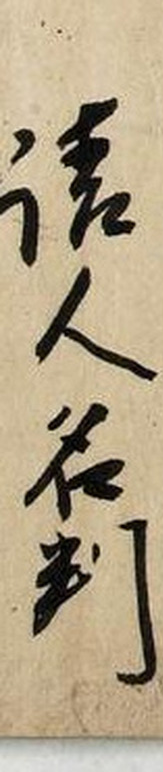請人名判

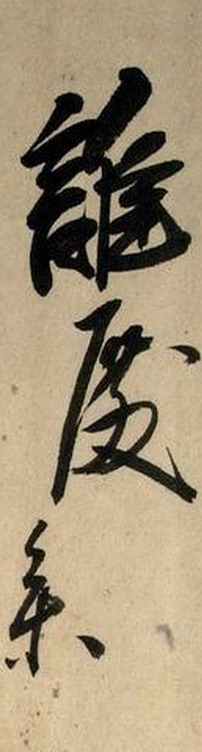誰殿参
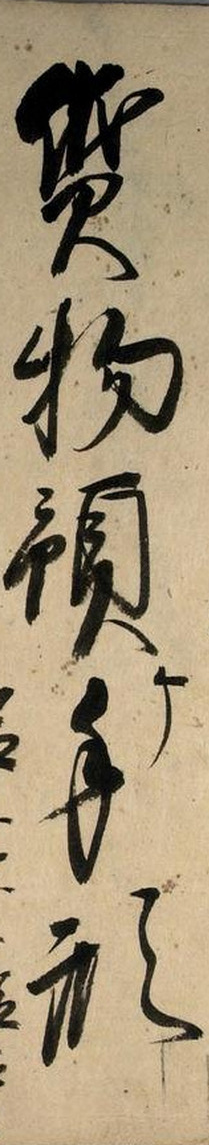質物預け手形
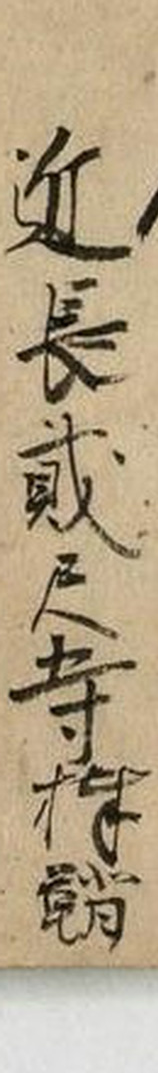近長弐尺五寸棒鞘
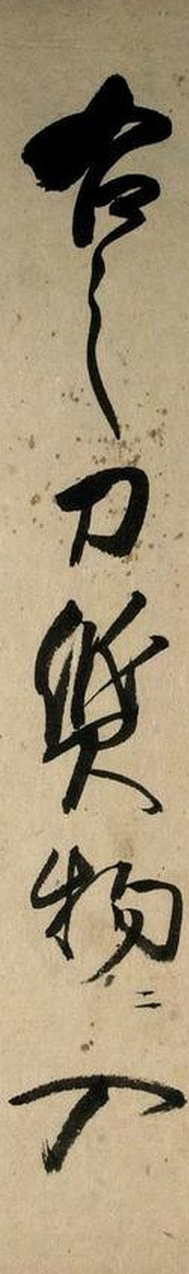右之刀質物に入
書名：御手本（手習、預リ申銀子之事、売渡申家屋敷事ほか）
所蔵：福井県文書館 Fukui Prefectural Archives
